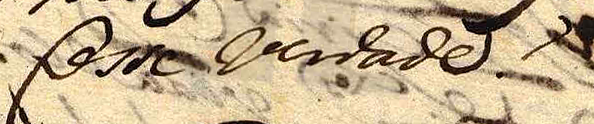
fosse verdade?
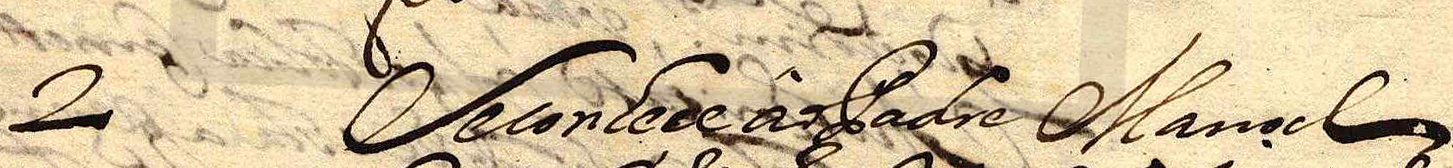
2 Se conhece ao Padre Manoel
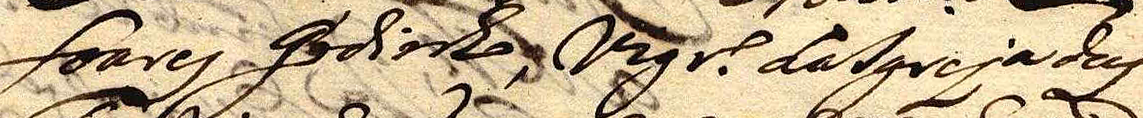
Soares Godinho, Vigr.o da Igreja das
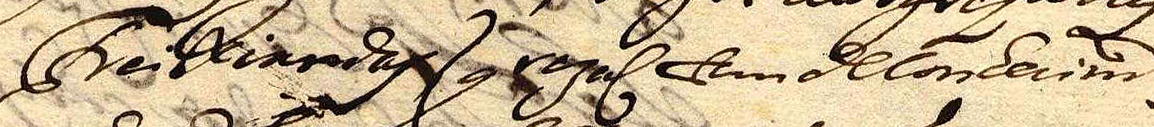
Freixiandas q̄ rezaꝭ tem de conhecimto
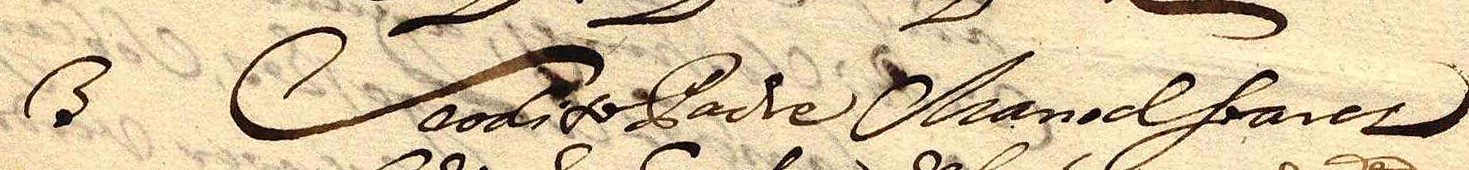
3 Se o dito Padre Manoel soares
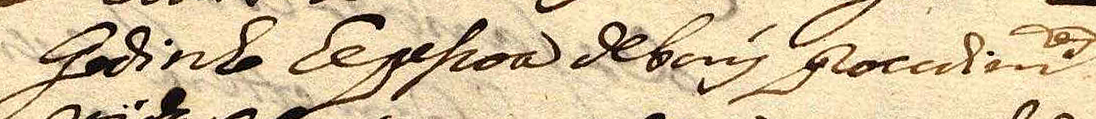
Godinho he pessoa de bon̄s procedimtos
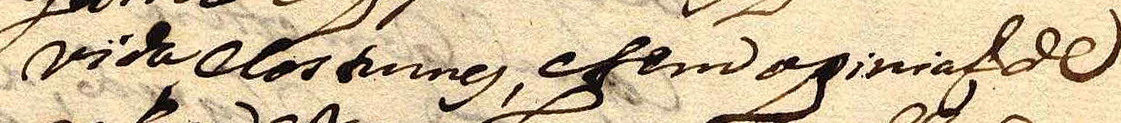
vida e costumes, e tem opiniaõ de
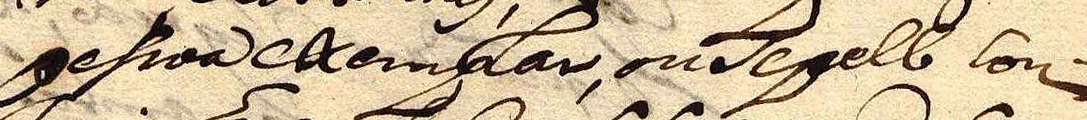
pessoa exemplar, ou se pello Con
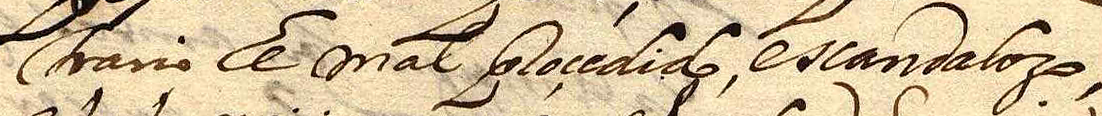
trario he mal pRocedido, escandalozo
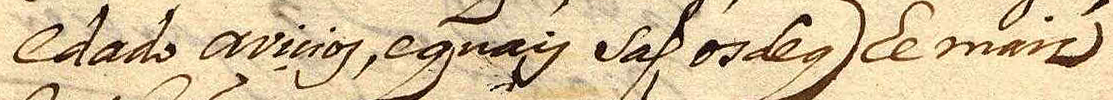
e dado a vicios, e quais saõ os de q̄ he maiz
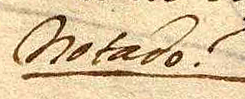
notado?
